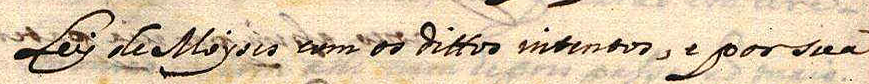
Lei de Moyses com os dittos intentos, e por sua
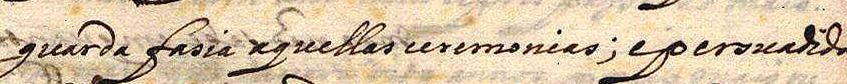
guarda fasia aquellas ceremonias; e persuadida
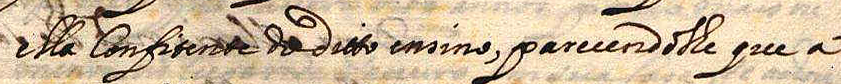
ella Confitente do ditto ensino, parecendo lhe que a
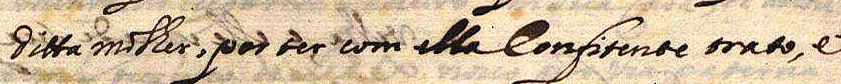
ditta mulher, por ter com ella Confitente trato, e
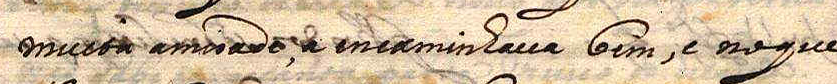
de muita amizade, a encaminhava bem, e no que
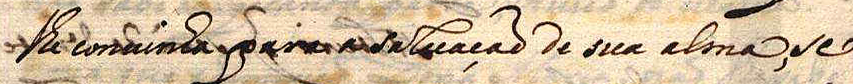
lhe convinha para a salvação da sua alma, se
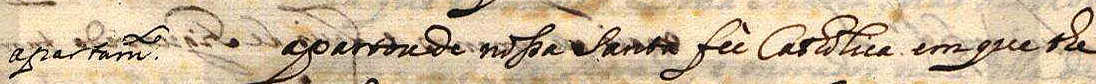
apartou de nossa Santa feè Catholica em que the
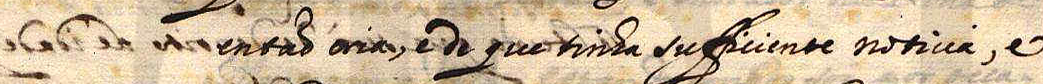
entaõ cria, e de que tinha sufficiente noticia, e
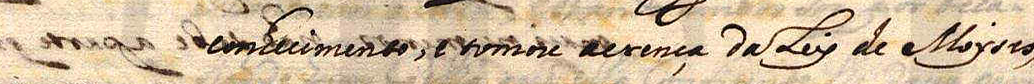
conhecimento, e tomou a crença da Lei de Moyses
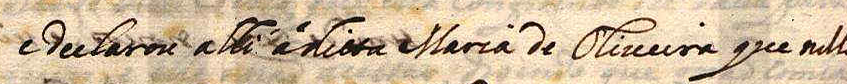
e declarou alli à dicta Maria de Oliveira que nella
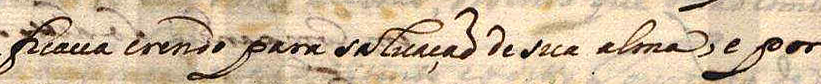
ficava crendo para salvação de sua alma, e por
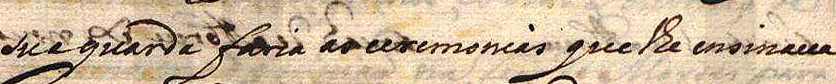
sua guarda faria as ceremonias que lhe ensinava
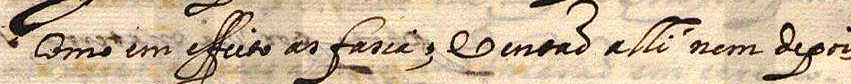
como em effeito fasia; e entaõ alli nem depois
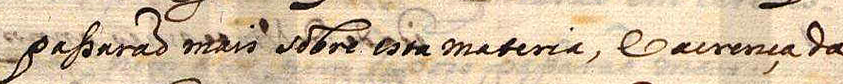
passaraõ mais sobre esta materia, e a crença da
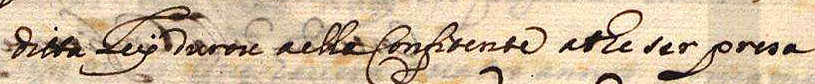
ditta Lei durou a ella Confitente athe ser presa
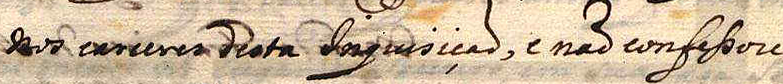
nos carceres desta Inquisiçaõ,e naõ confessou
